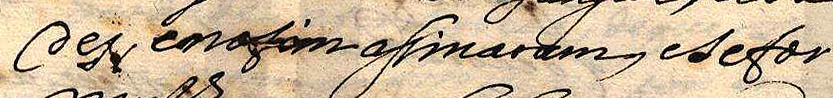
des, e no fim assinaram, e se for
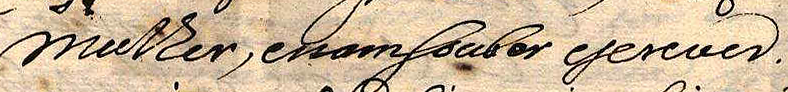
mulher, e nam souber escrever.
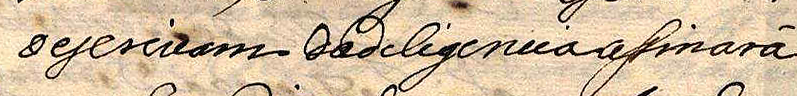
o escriuam da deligencia assinará
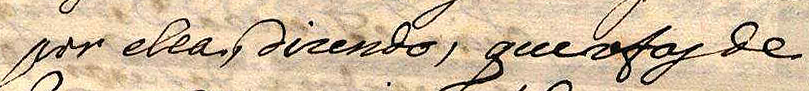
por ella, dizendo, que o fas de
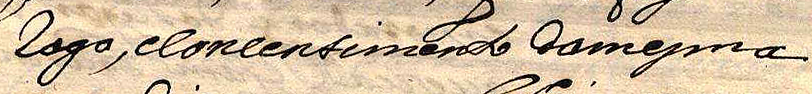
Rogo, e concentimento da mesma
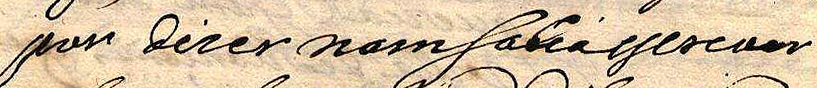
por dizer nam sabia escrever
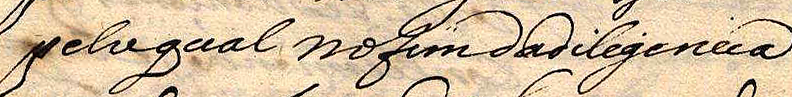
pelo qual no fim da diligencia
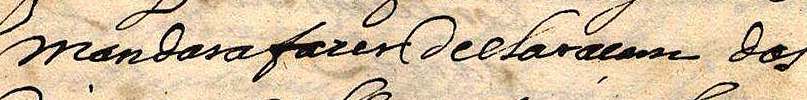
mandara fazer declaraçam dos
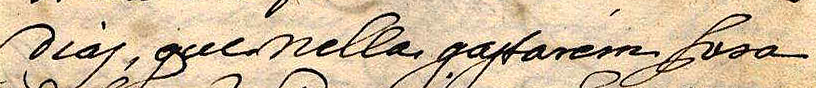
dias, que nella gastarem fora
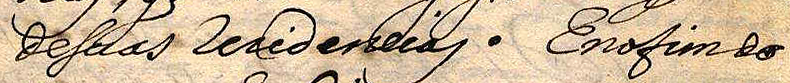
de suas Rezidencias. E no fim do
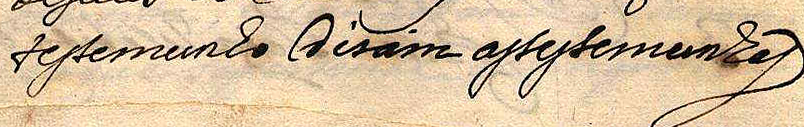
testemunho diram as testemunhas
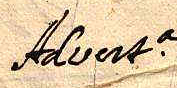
Advert.a
